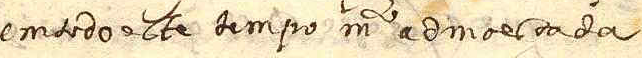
em todo este tempo mto admoestada
